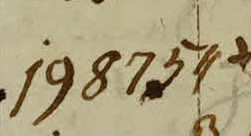198754
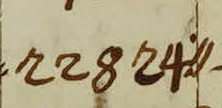22824.
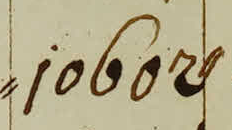10602
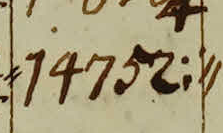14752:
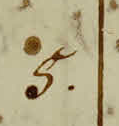5.
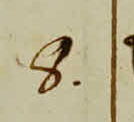8.
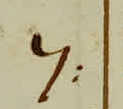7:
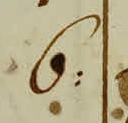6:
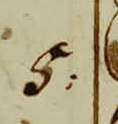5:
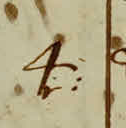4:
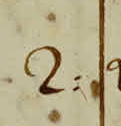2:
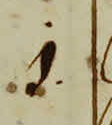1.
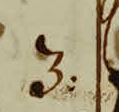3:
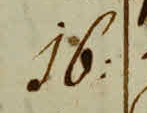16:
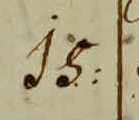15:
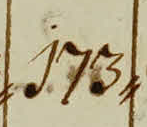173
